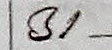31
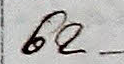62
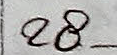28
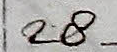28
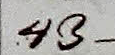43
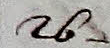26
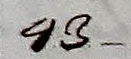43
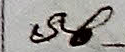56
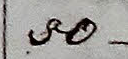50
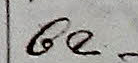62
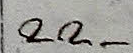22
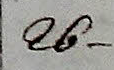26
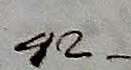42
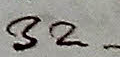32
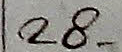28
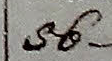56
